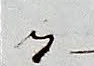7
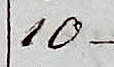10
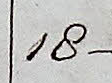18
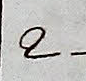2
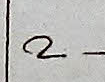2
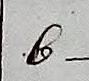6
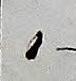1
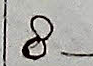8
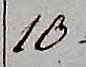10
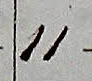11
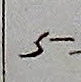5
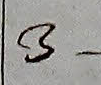3
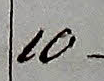10
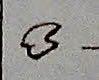3
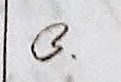3.
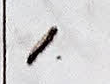1.
